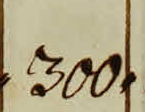300
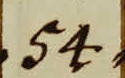54
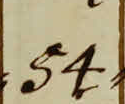54
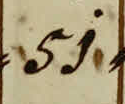51
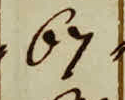67
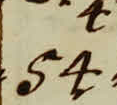54
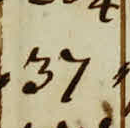37
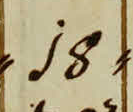18
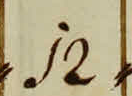12
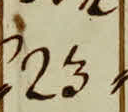23
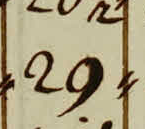29
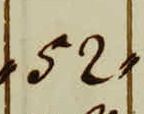52
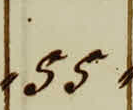55
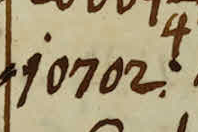10702.
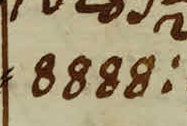8888
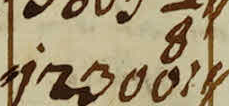123001
